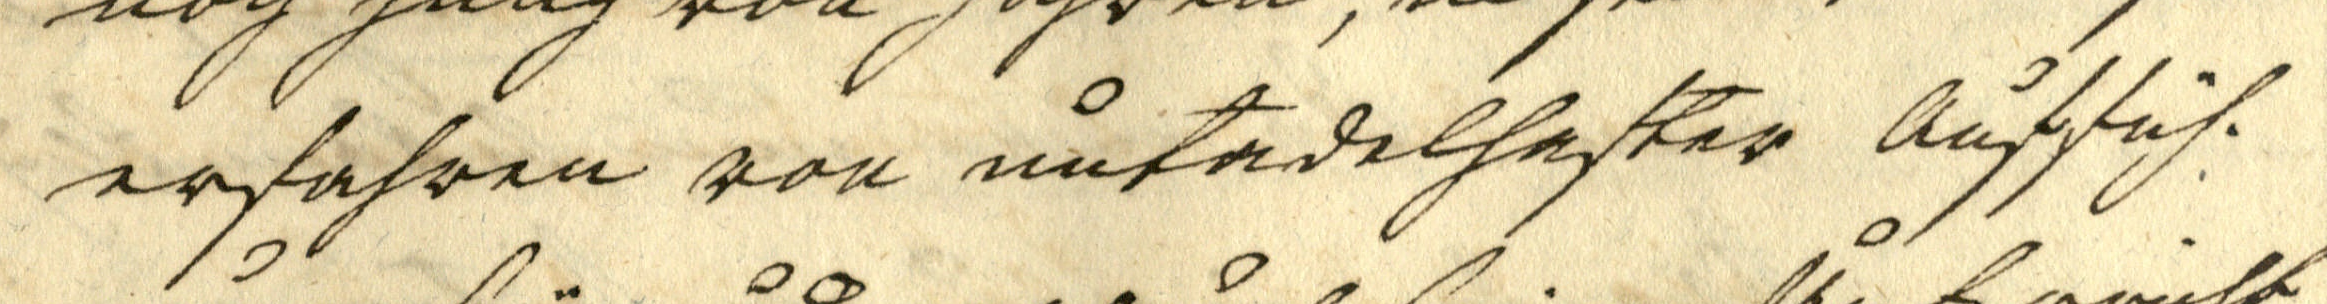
erfahren von untadelhafter Auffüh¬
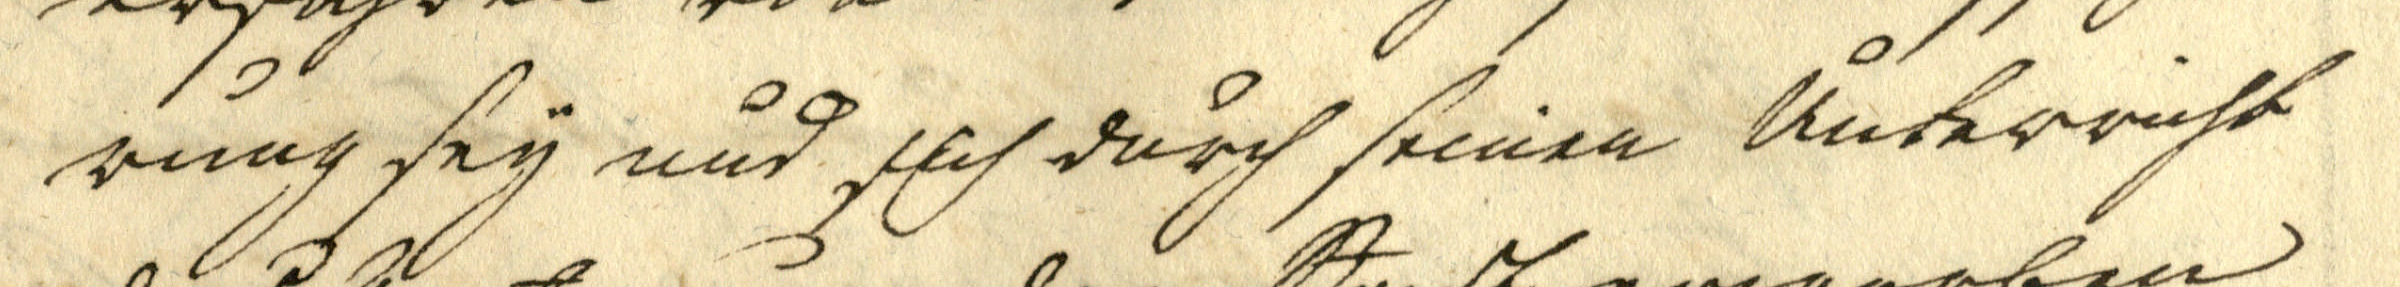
rung sey und sich durch seinen Unterricht
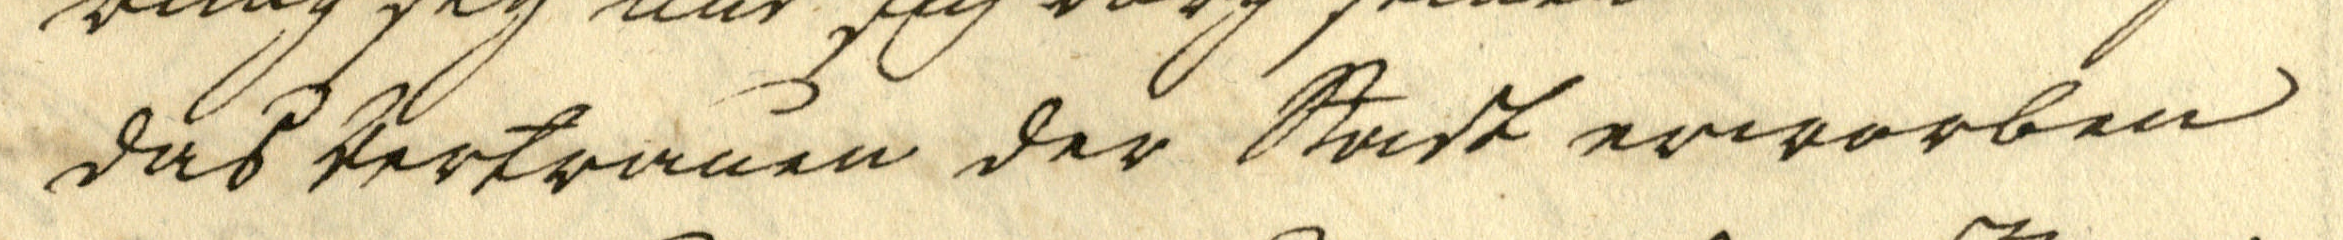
das Vertrauen der Stadt erworben
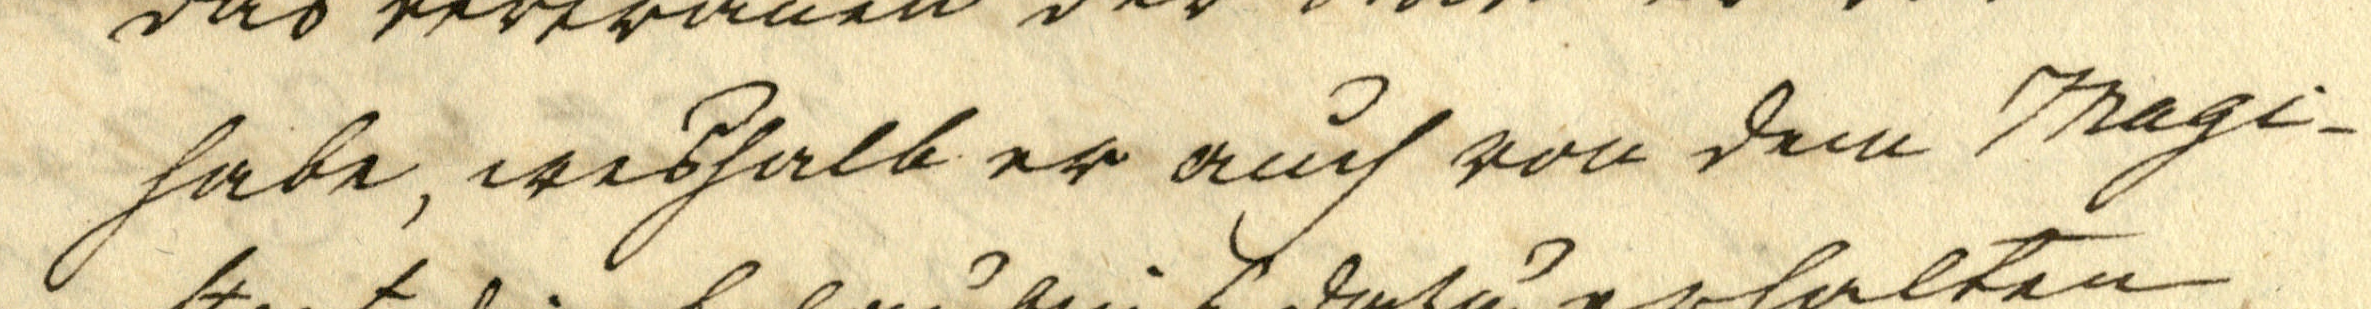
habe, weshalb er auch von dem Magi¬
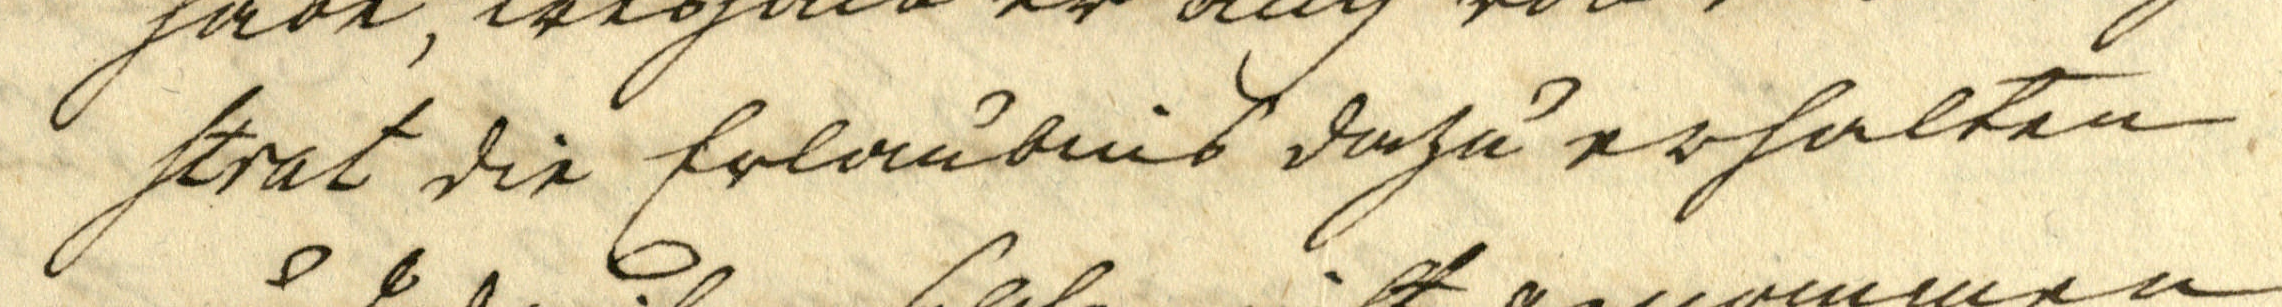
strat die Erlaubnis dazu erhalten
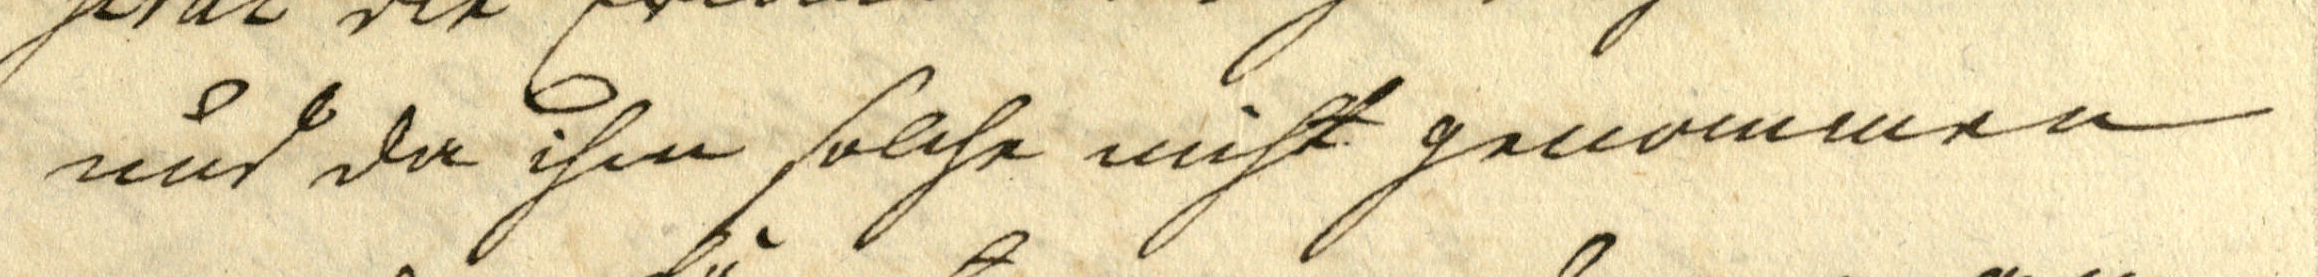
und da ihm solche nicht genommen
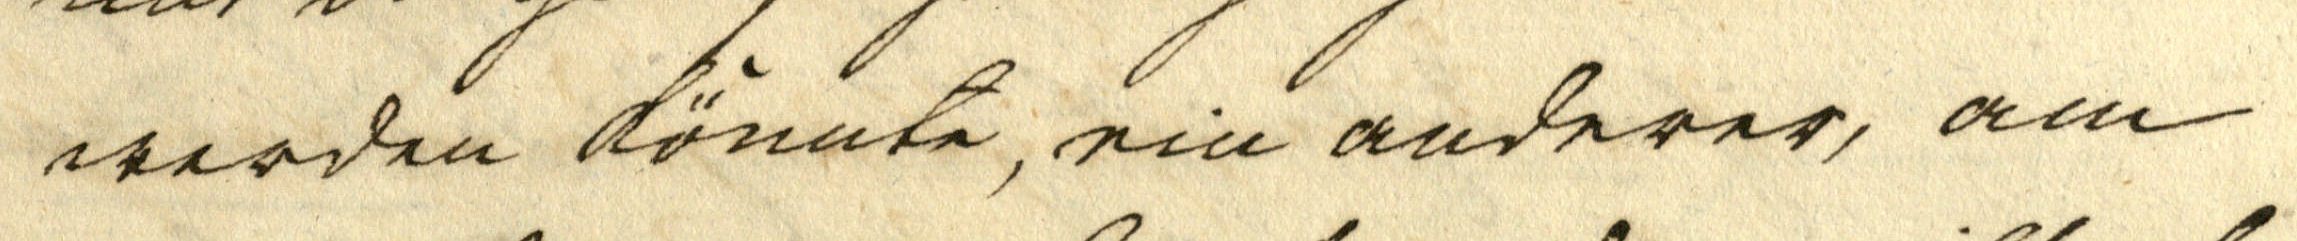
werden könnte, ein anderer, am
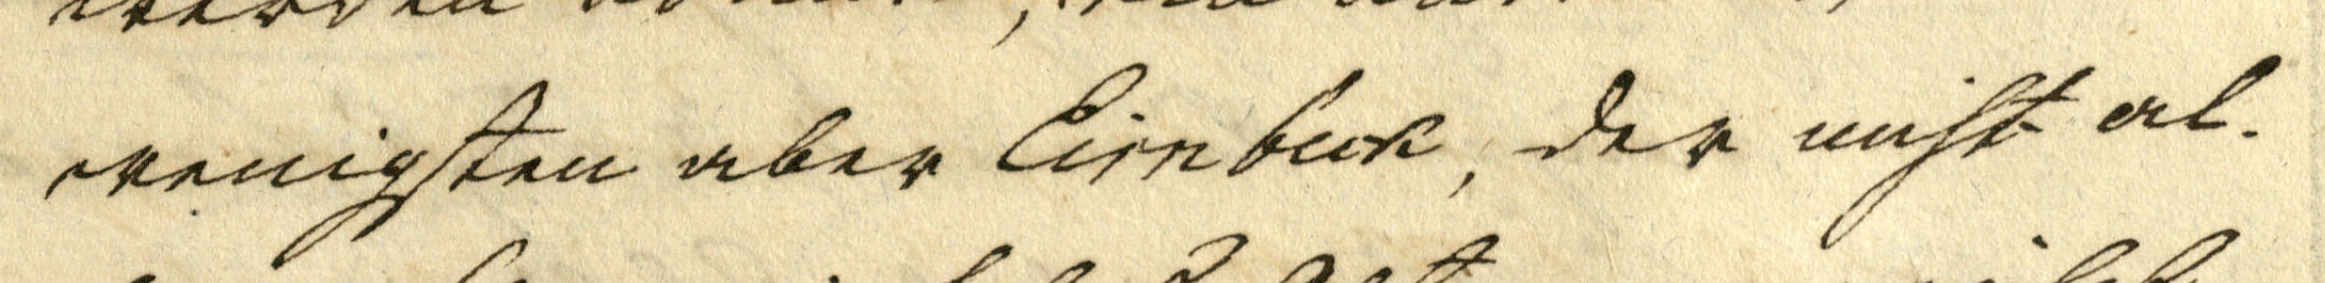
wenigsten aber Eimbeck, der nicht al¬
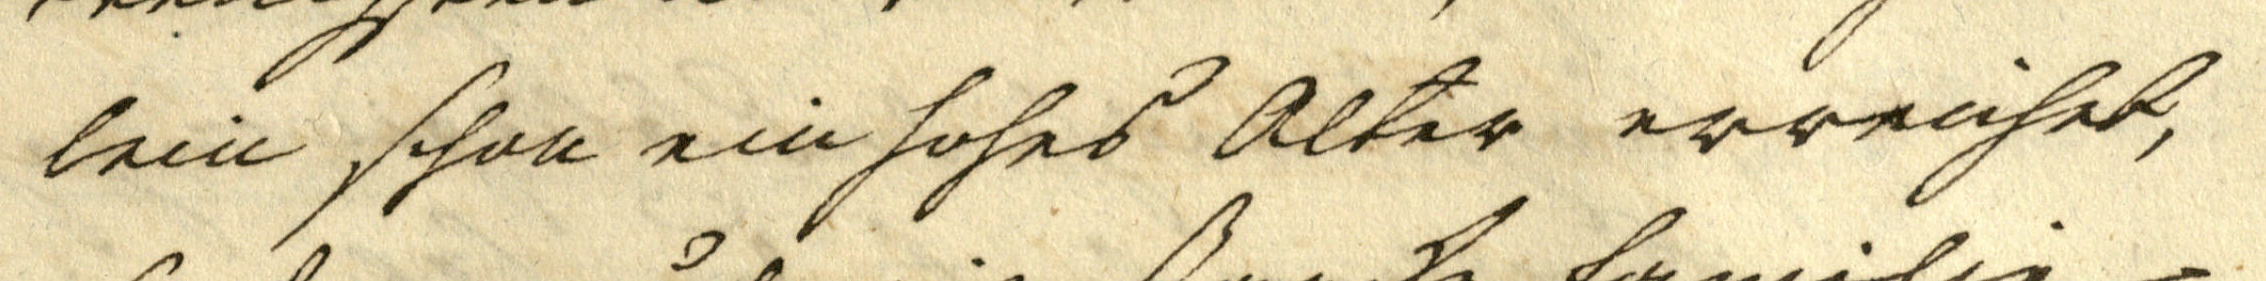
lein schon ein hohes Alter erreichet,
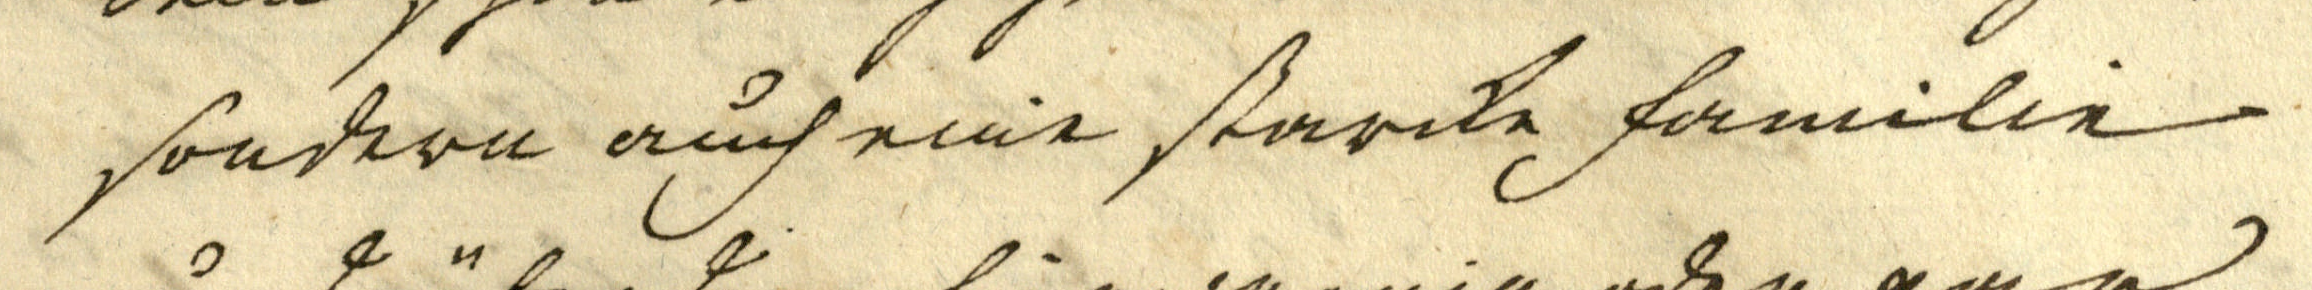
sondern auch eine starcke Familie
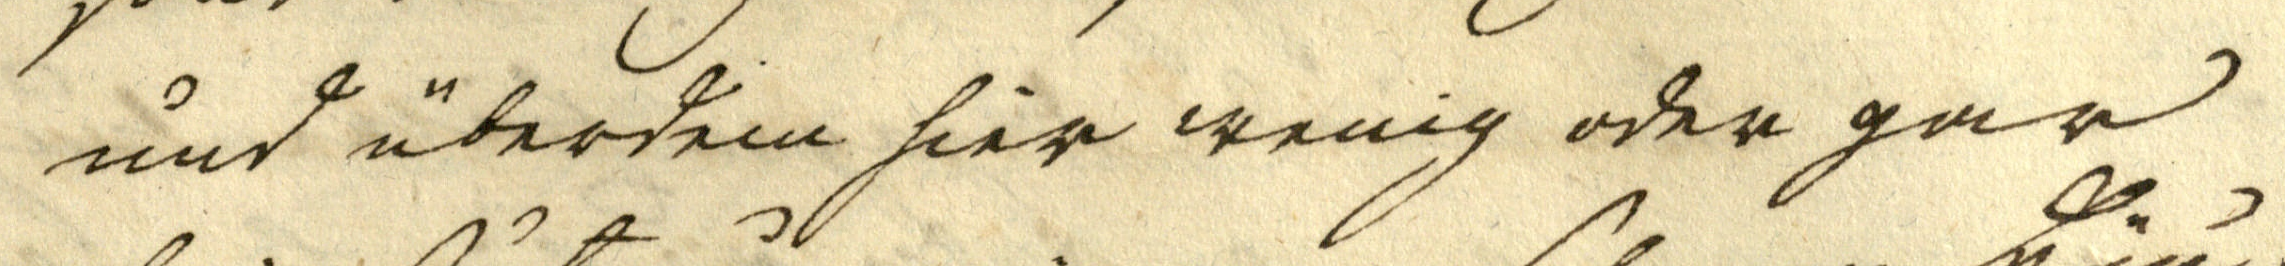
und überdem hier wenig oder gar
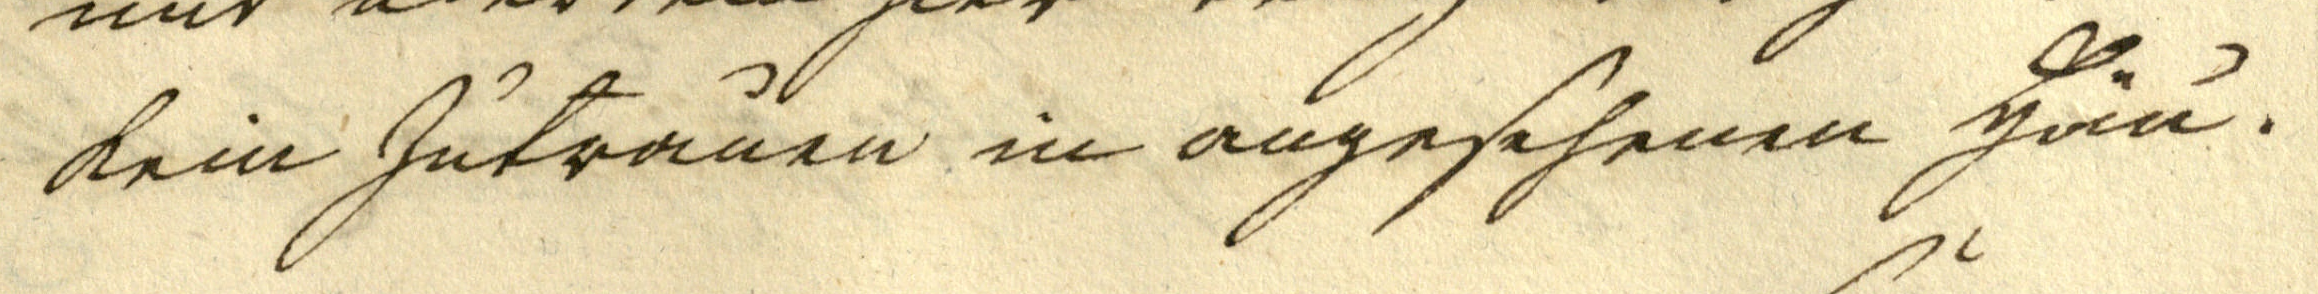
kein Zutrauen in angesehenen Häu¬
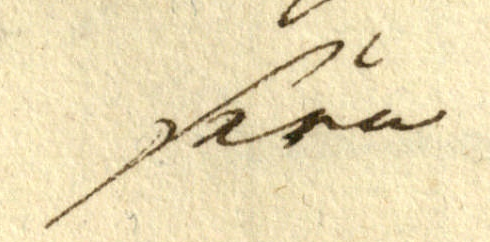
sern
